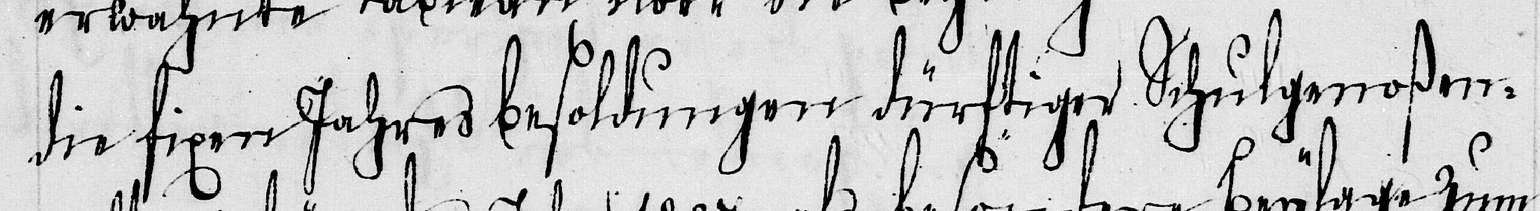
die fixen Jahresbesoldungen dürftiger Schulgenoßen¬
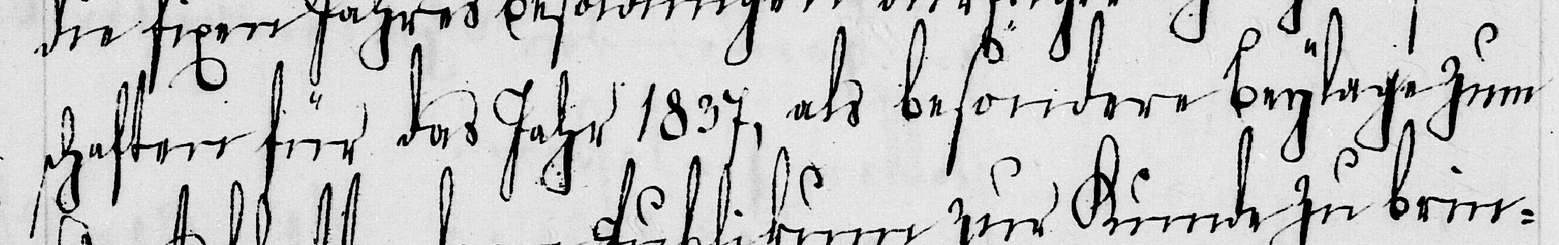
schaften für das Jahr 1837, als besondere Beylage zum
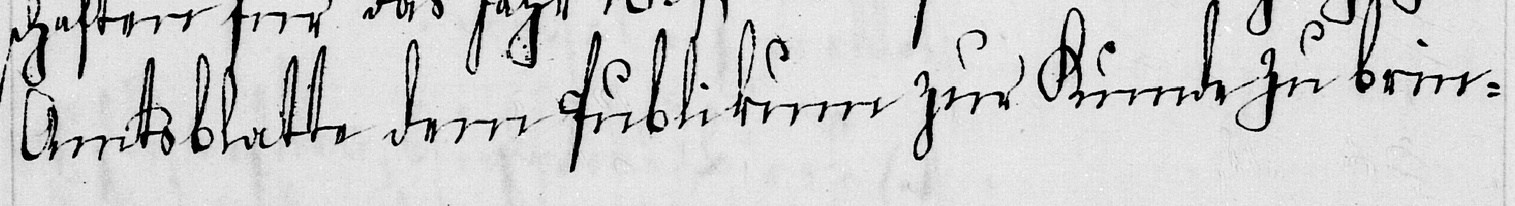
Amtsblatte dem Publikum zur Kunde zu brin¬
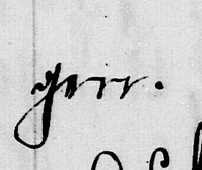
gen.
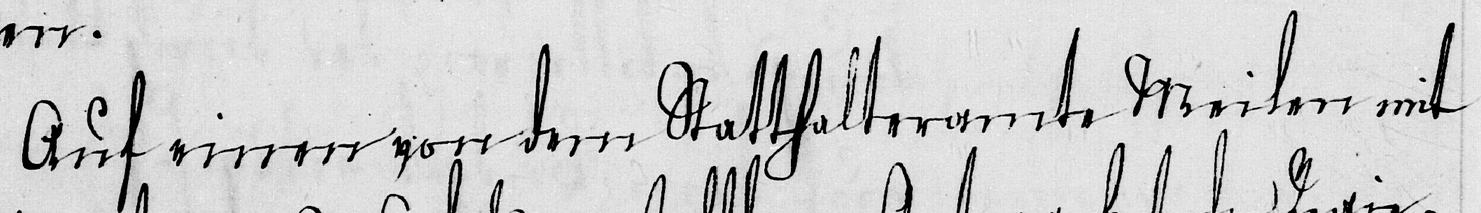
Auf einen von dem Statthalteramt Meilen mit
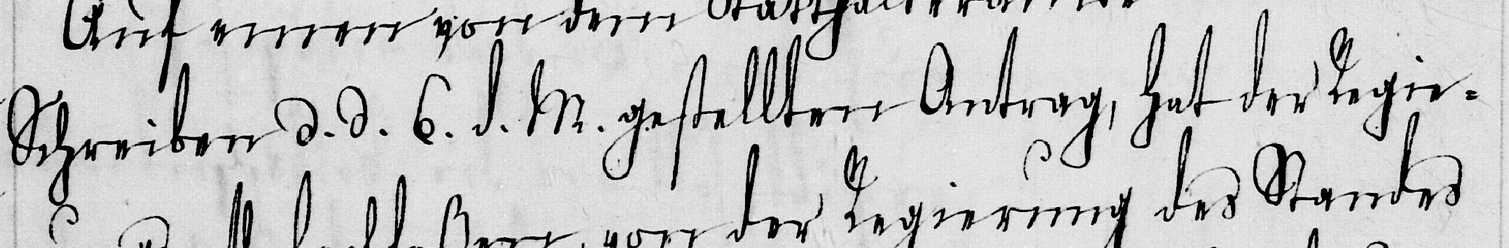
Schreiben d. d. 6. d. M. gestellten Antrag, hat der Regie¬
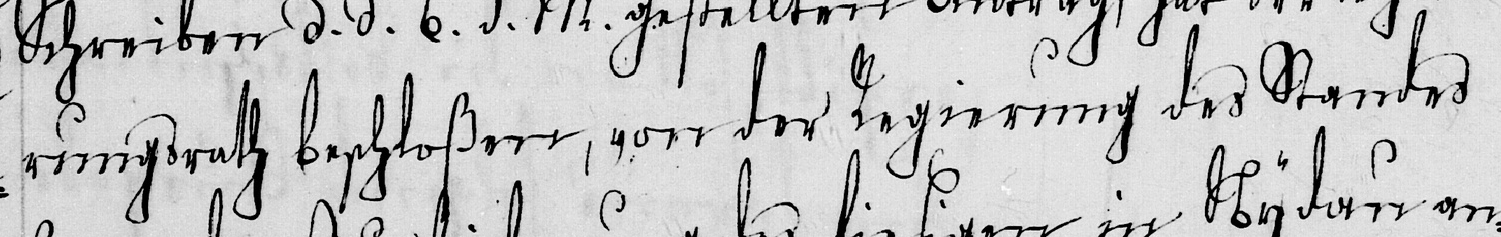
rungsrath beschloßen, von der Regierung des Standes
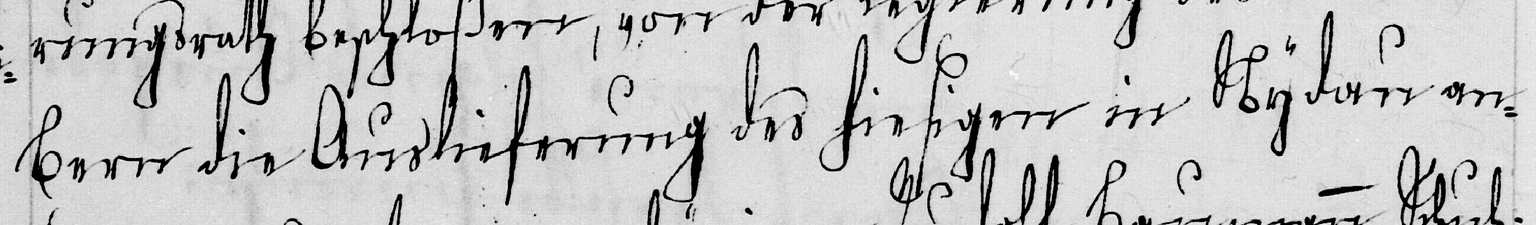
Bern die Auslieferung des hiesigen in Nydau an¬
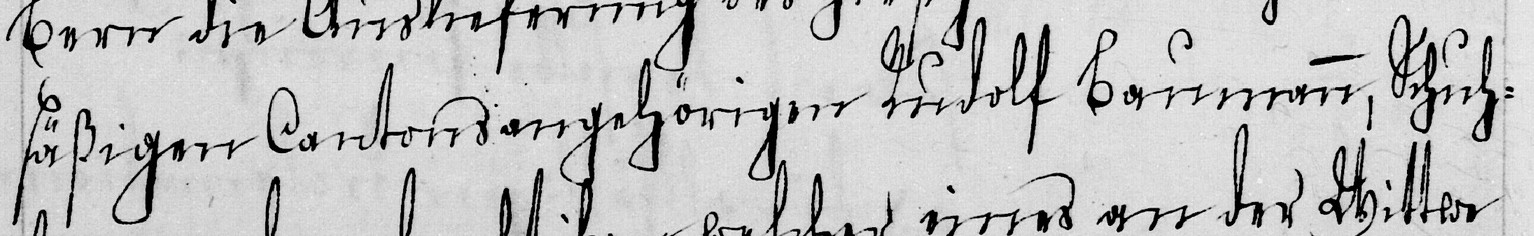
säßigen Cantonsangehörigen Rudolf Baumann, Schuh¬
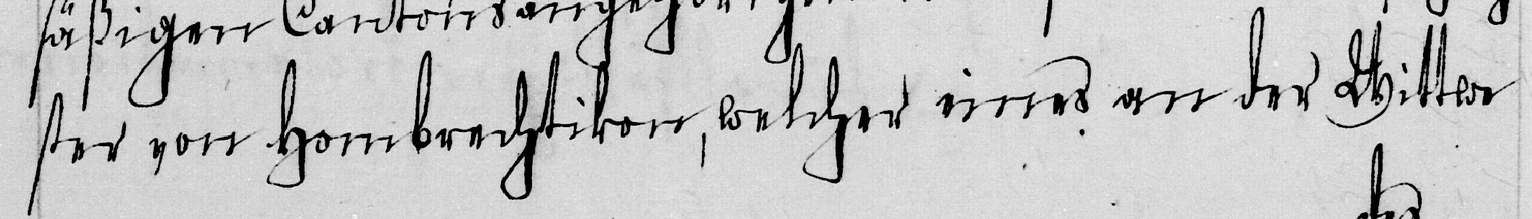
ster von Hombrechtikon, welcher eines an der Wittwe
